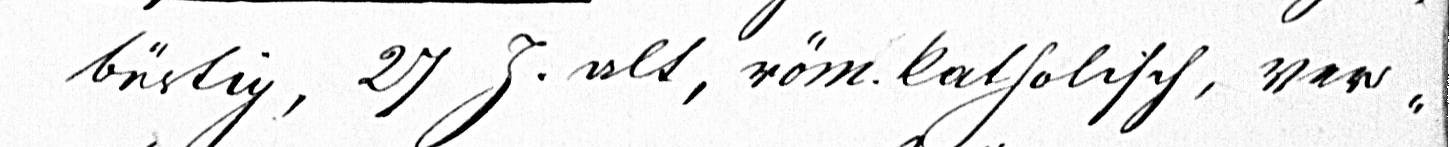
bürtig, 27 J. alt, röm. katholisch, ver¬
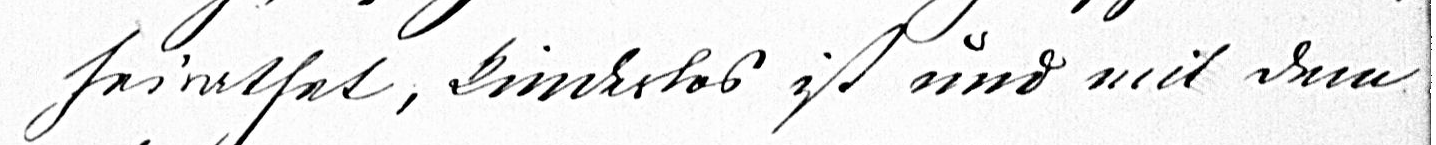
heirathet, kinderlos ist und mit dem
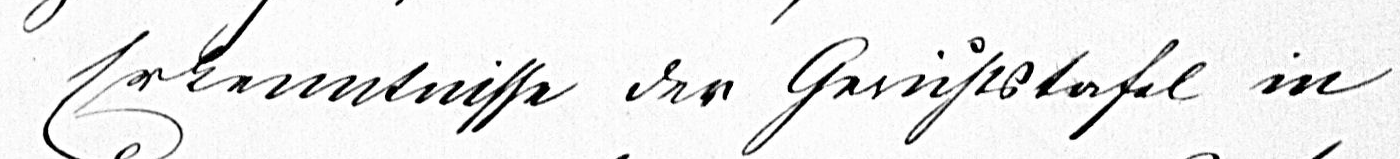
Erkenntnisse der Gerichtstafel in
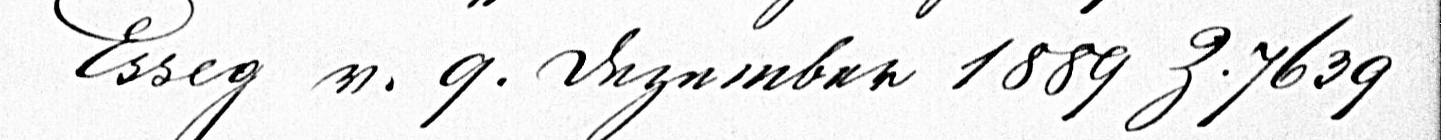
Esseg v. 9. Dezember 1889 Z. 7639
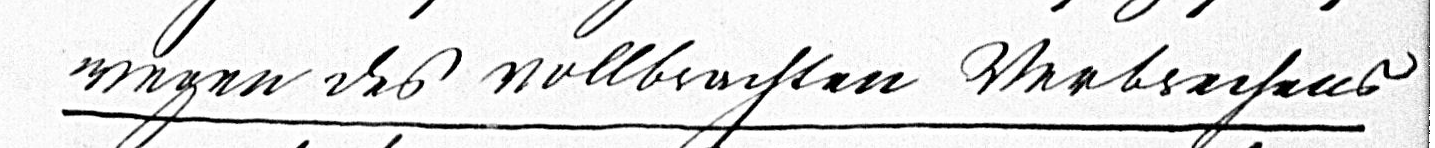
wegen des vollbrachten Verbrechens
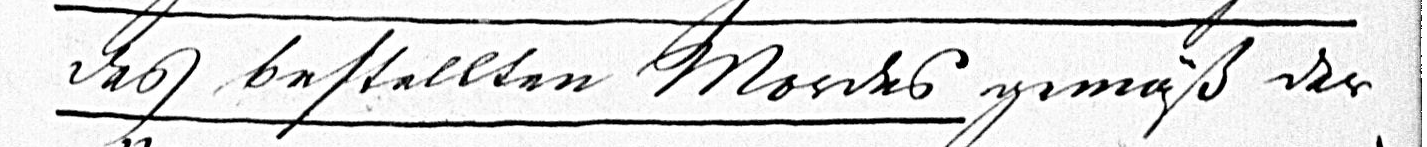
des bestellten Mordes gemäß der
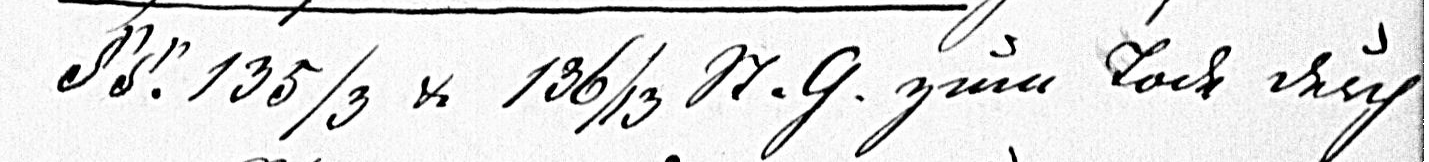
xx 135/3 & 136/13 St. G. zum Tode durch
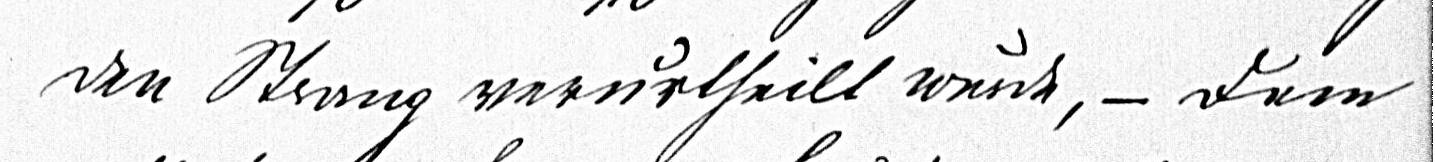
den Strang verurtheilt wurde,- dem
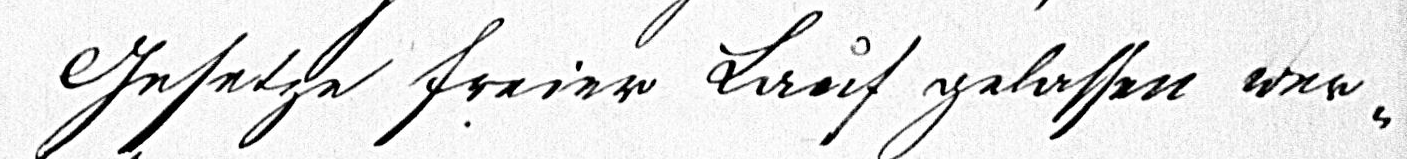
Gesetze freier Lauf gelassen wer¬
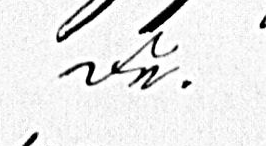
de.
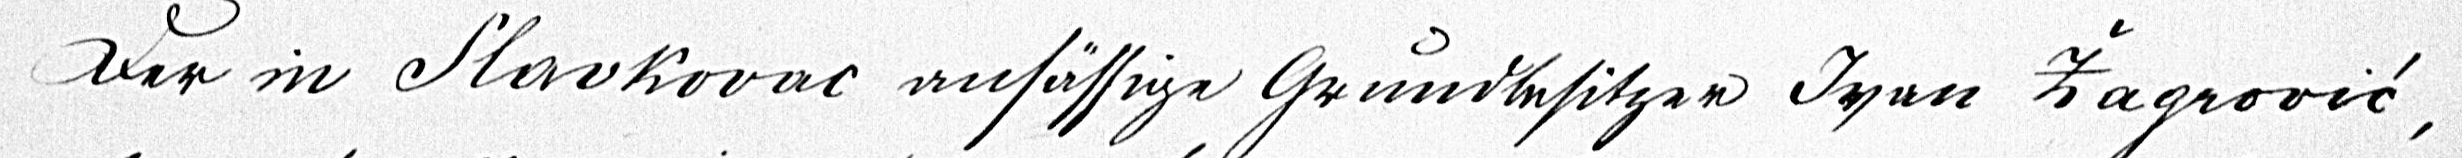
Der in Slavkovac ansässige Grundbesitzer Ivan Zagrović,
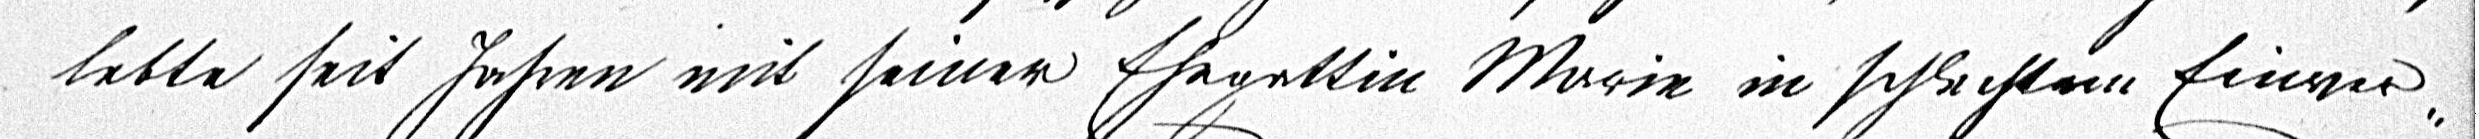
lebte seit Jahren mit seiner Ehegattin Marie in schlichtem Einver¬
